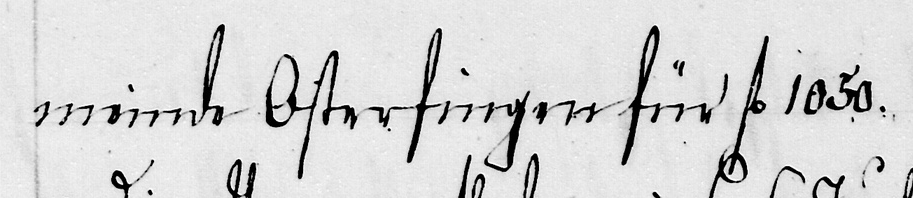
meinde Osterfingen für fl. 1050.
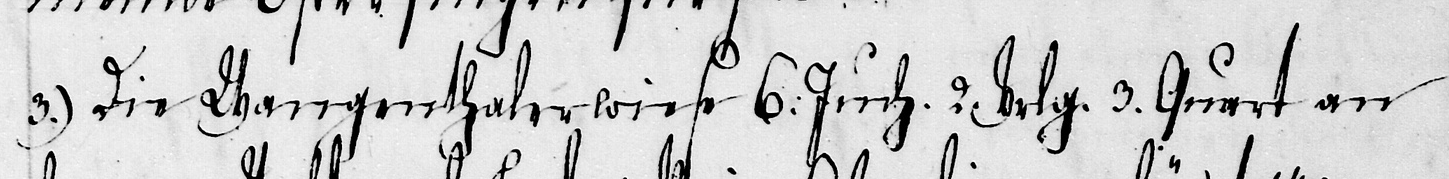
3.) Die Wangenthalerwiese 6. Juch. 2. Vrlg. 3. Quart an
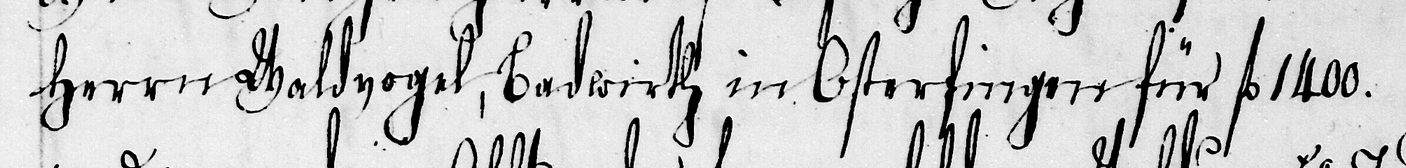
Herrn Waldvolgel, Badwirth in Osterfingen für fl. 1400.
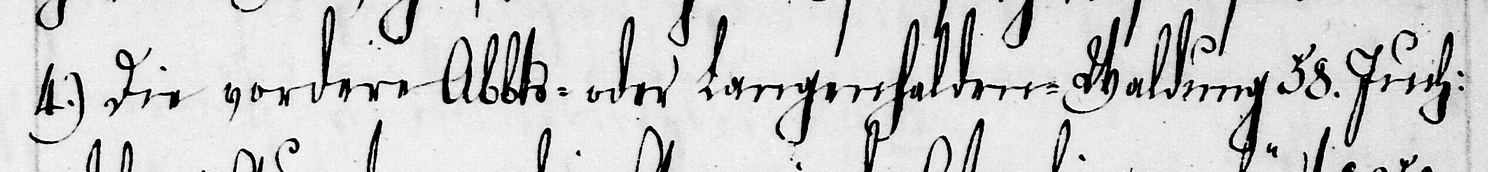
4.) Die vordere Abbts- oder Langenhalden-Waldung 58. Juch:
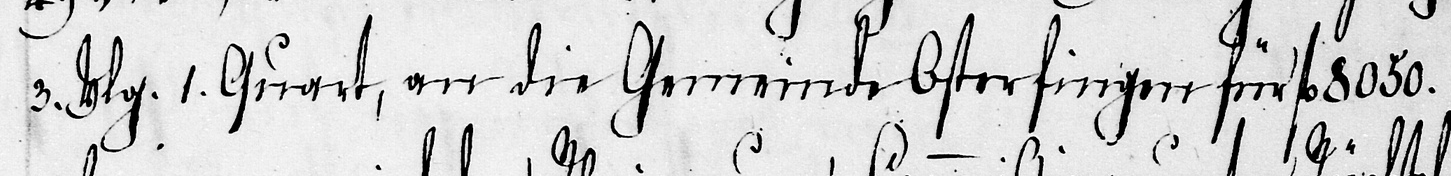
3. Vlg. 1. Quart, an die Gemeinde Osterfingen für fl. 8050.
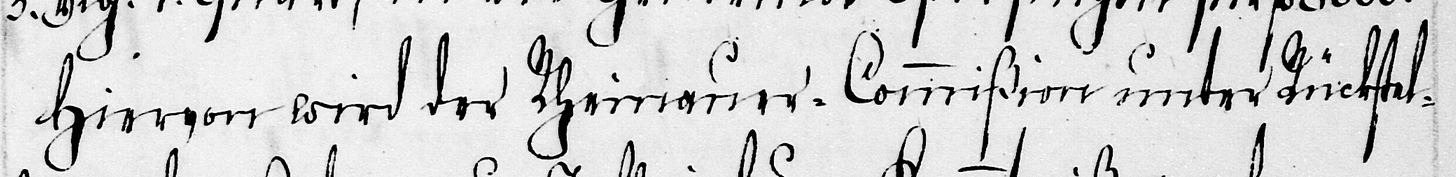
Hiervon wird der Rheinauer-Commißion unter Rückstel¬
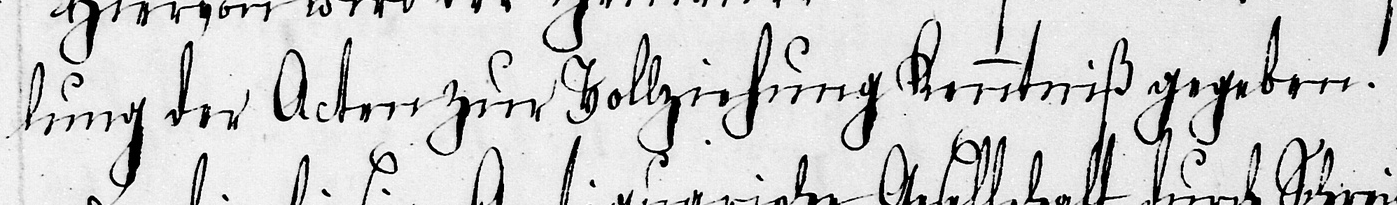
lung der Acten zur Vollziehung Kenntniß gegeben.
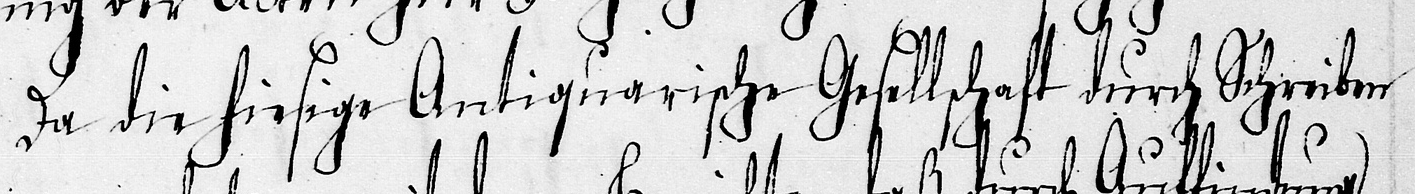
Da die hiesige Antiquarische Gesellschaft durch Schreiben
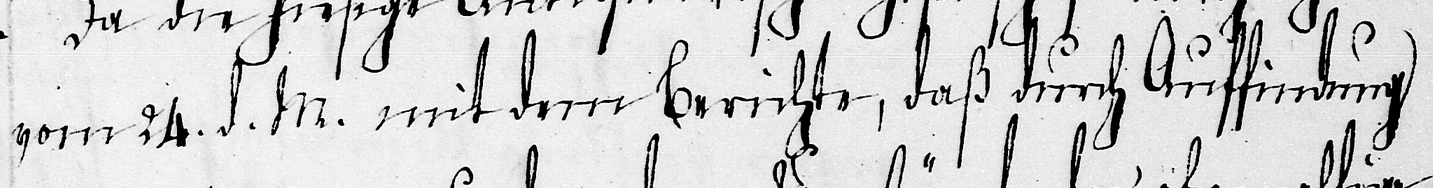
vom 24. d. M. mit dem Berichte, daß durch Auffindung
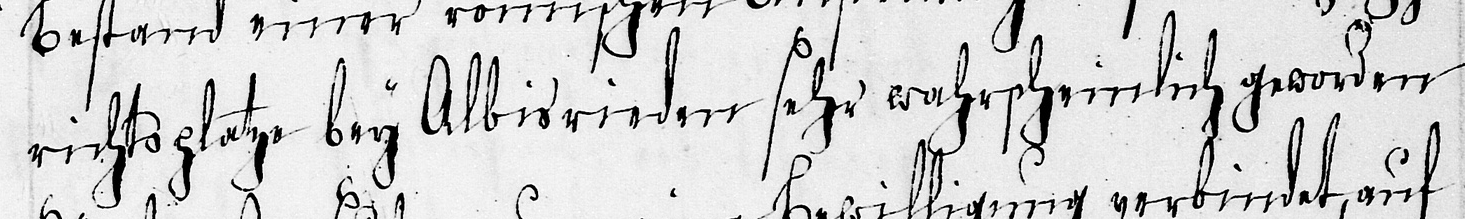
erichtsplatze bey Albisrieden sehr wahrscheinlich geworden
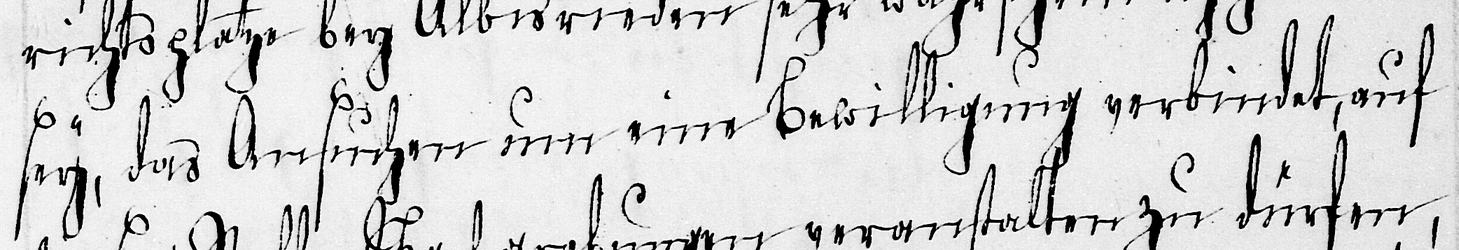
sey, das Ansuchen um eine Bewilligung verbindet, auf
